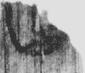曰
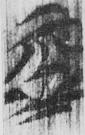亞（胡）
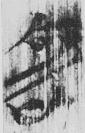害
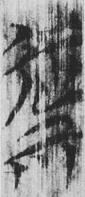○（禍）
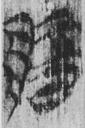𨟻（將）
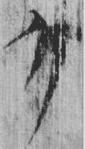大
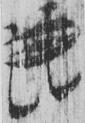母
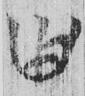曰
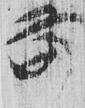可（何）
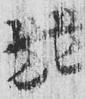戔（殘）
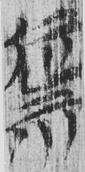○（禍）
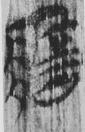𨟻（將）
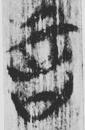言（延）
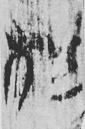枳
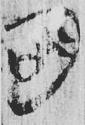名（銘）
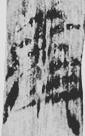隹（唯）
